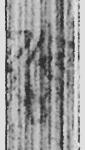{人䏌心}
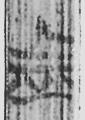者
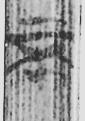不
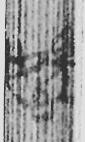{女𡵂心}
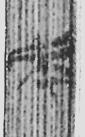民
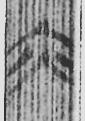亦
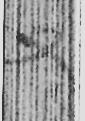又
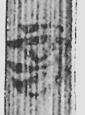言
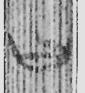曰
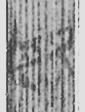悔（謀）
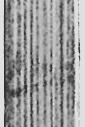亡
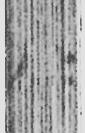小人
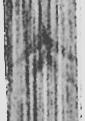大
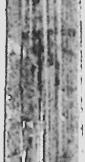而
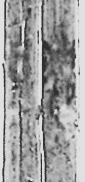器
